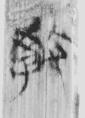教
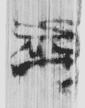者
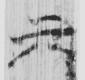亓
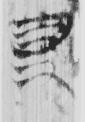𠭁
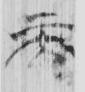而
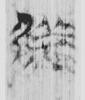備
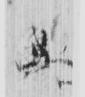之
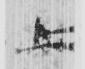上
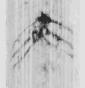亦
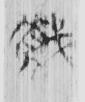蔑
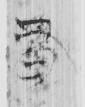有
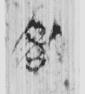咎
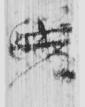𡚦
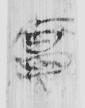貴
